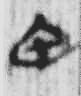甶（思）
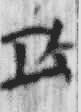攻
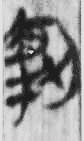解
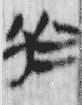於
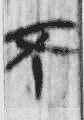不
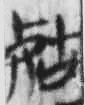○（辜）
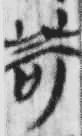苛
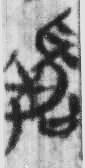○（嘉）
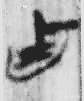占
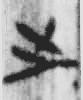之
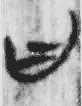曰
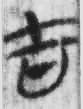吉
